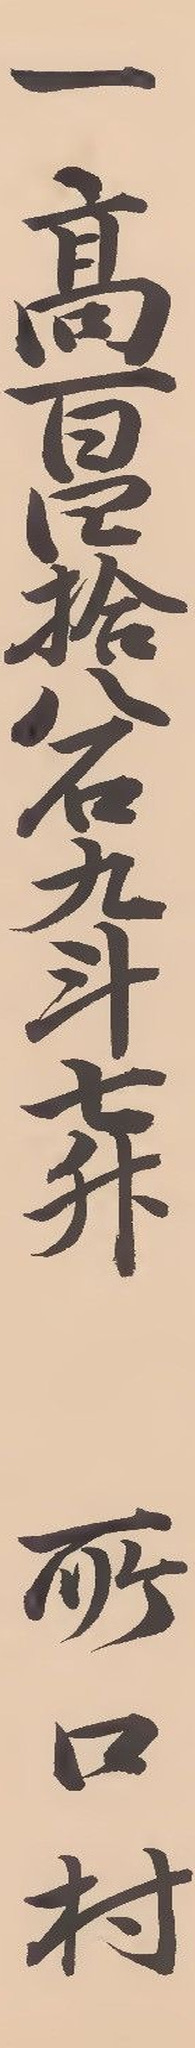一高百四拾八石九斗七升所口村
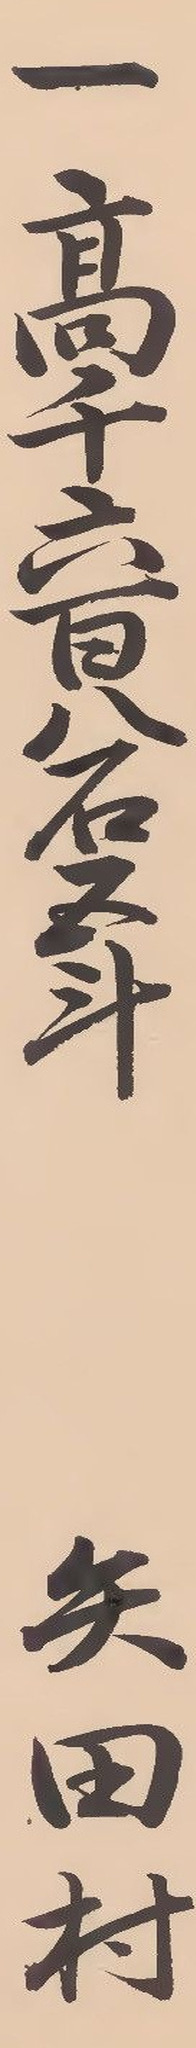一高千六百八石五斗矢田村
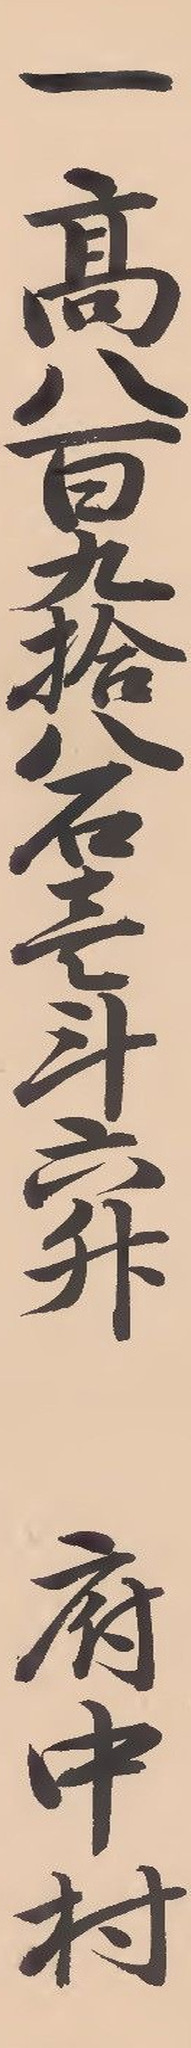一高八百九拾八石壱斗六升府中村
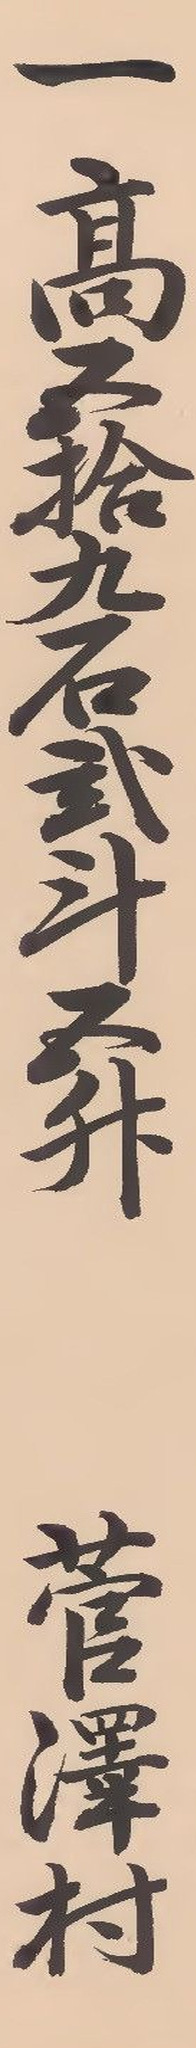一高五拾九石弐斗五升菅沢村
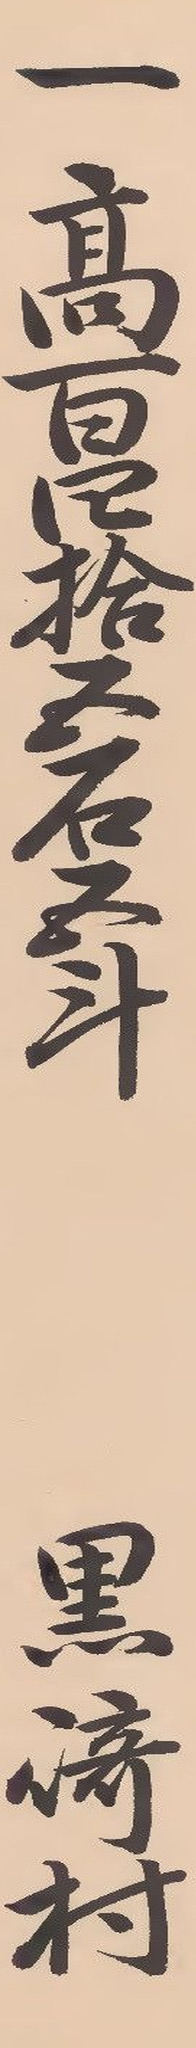一高百四拾五石五斗黒崎村
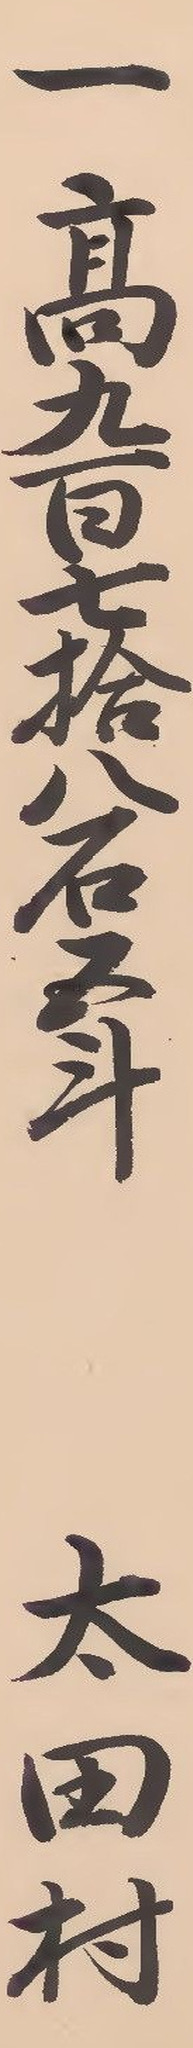一高九百七拾八石五斗太田村

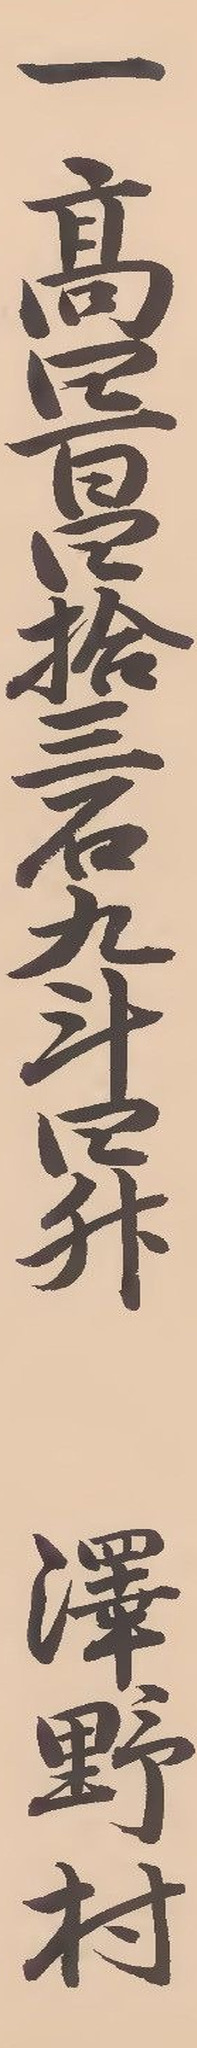一高四百四拾三石九斗四升沢野村
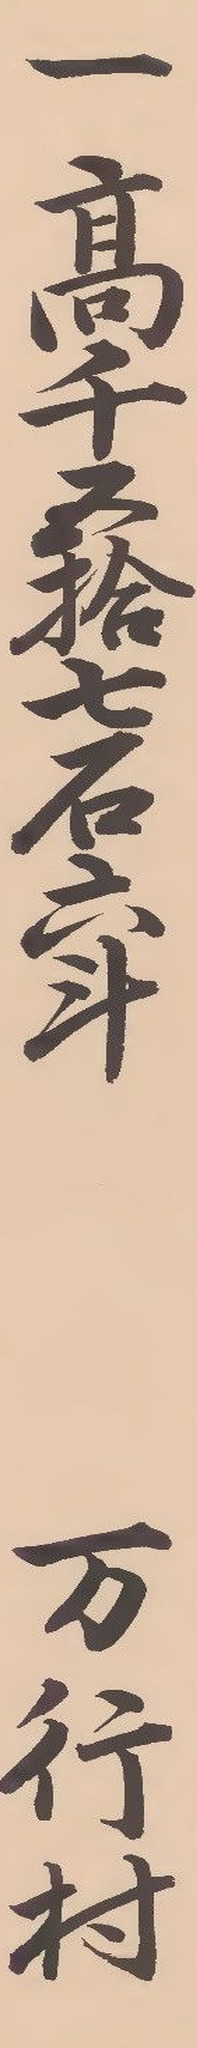一高千五拾七石六斗万行村

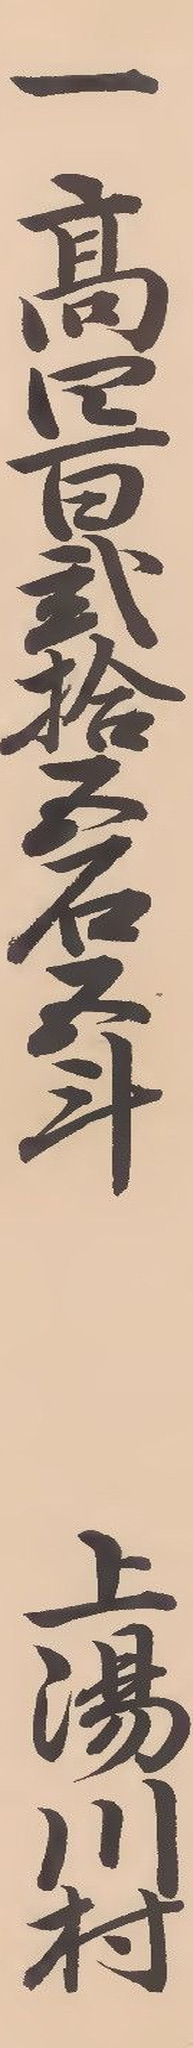一高四百弐拾五石五斗上湯川村
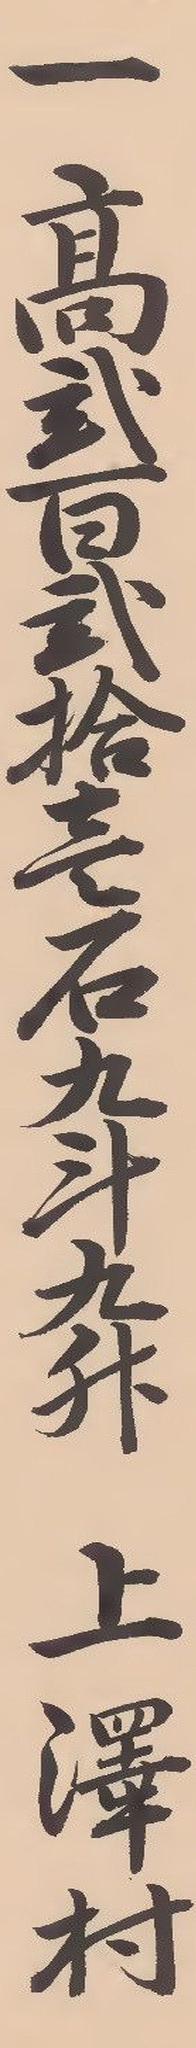一高弐百弐拾壱石九斗九升上沢村
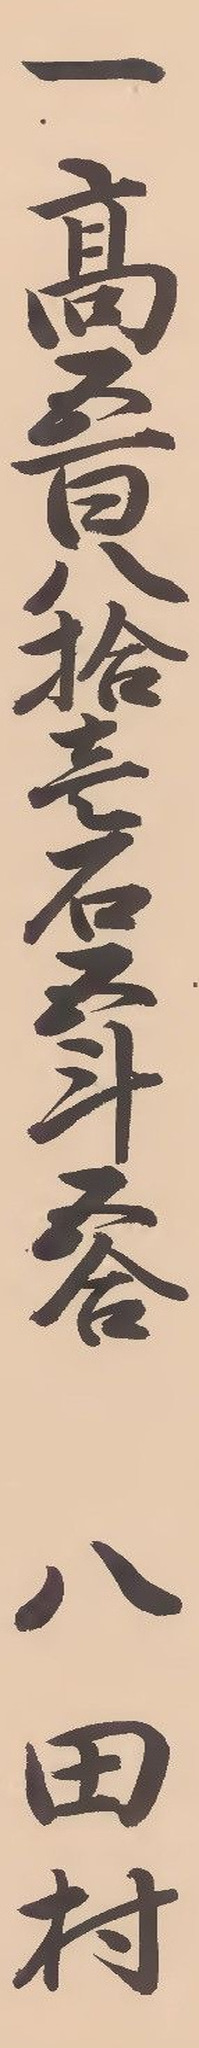一高五百八拾壱石五斗五合八田村
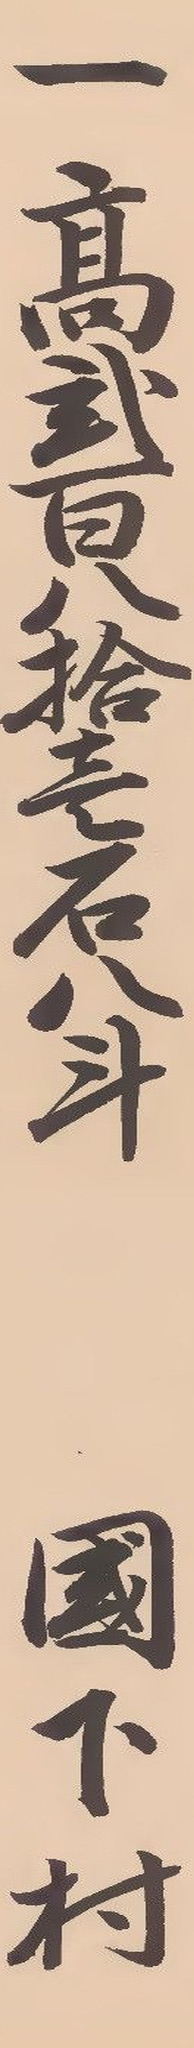一高弐百八拾壱石八斗国下村
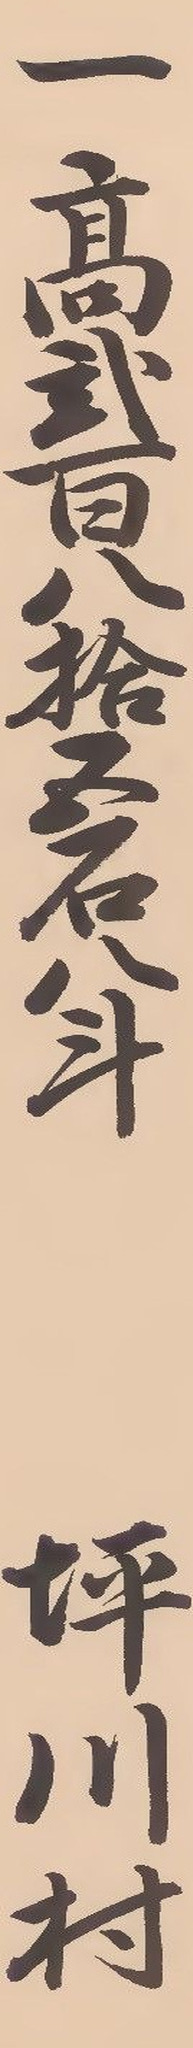一高弐百八拾五石八斗坪川村

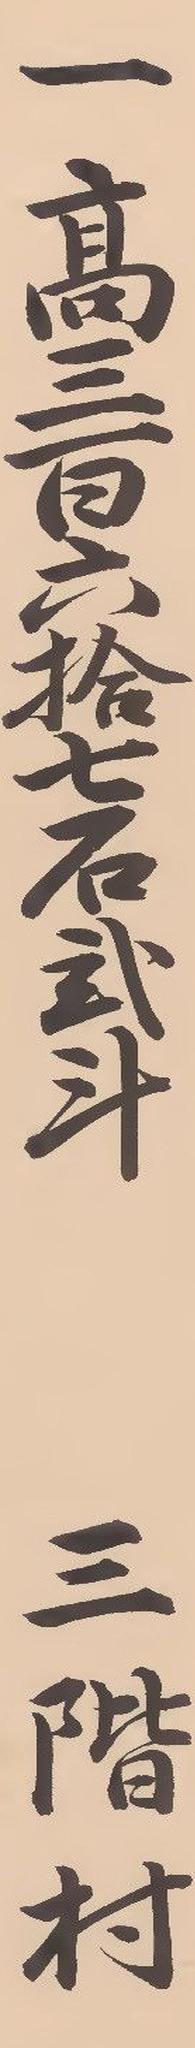一高三百六拾七石弐斗三階村
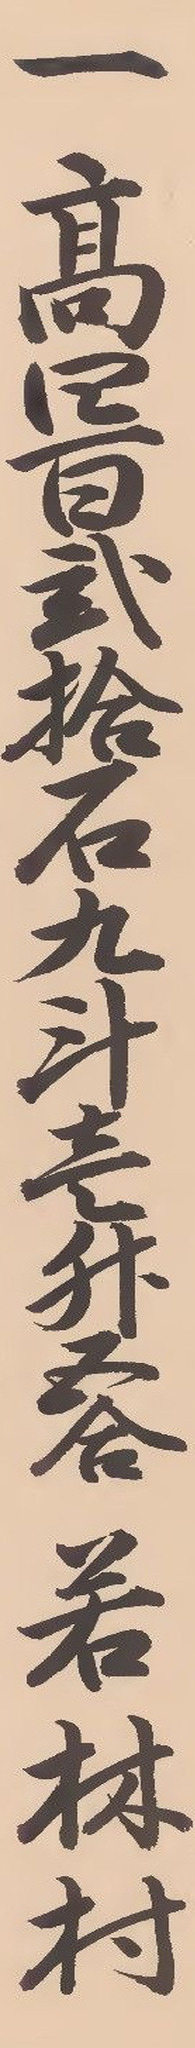一高四百弐拾石九斗壱升五合若林村
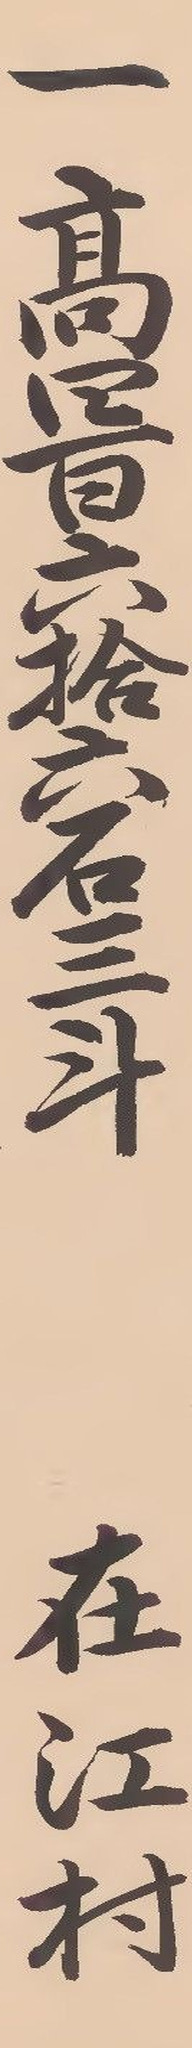一高四百六拾六石三斗在江村
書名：能登国郷帳
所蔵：国立公文書館 National Archives of Japan
